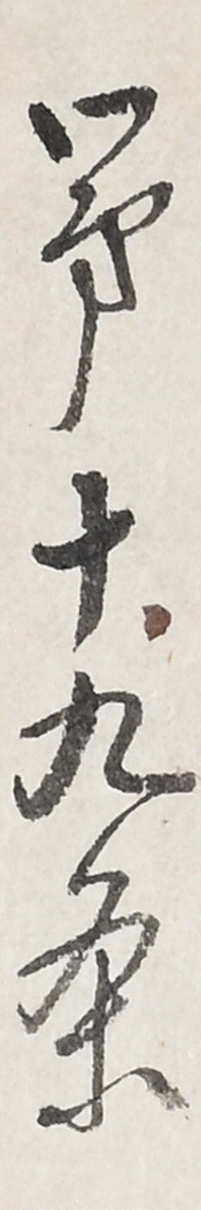第十九条
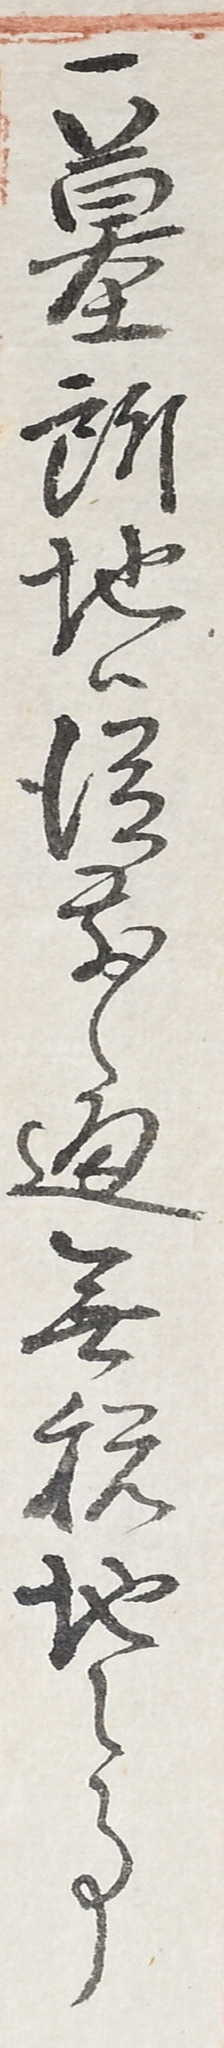一墓所地ハ従前之通無税地之事
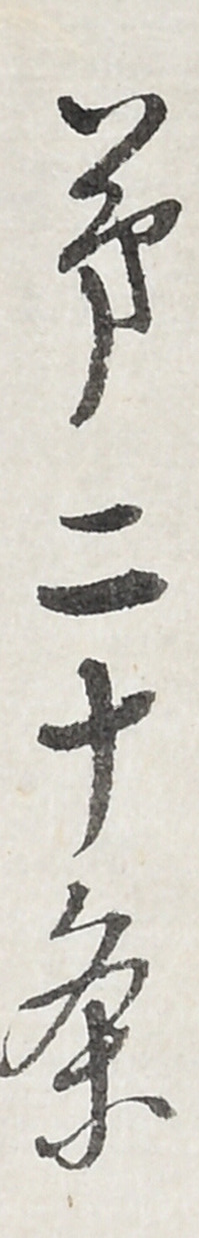第二十条
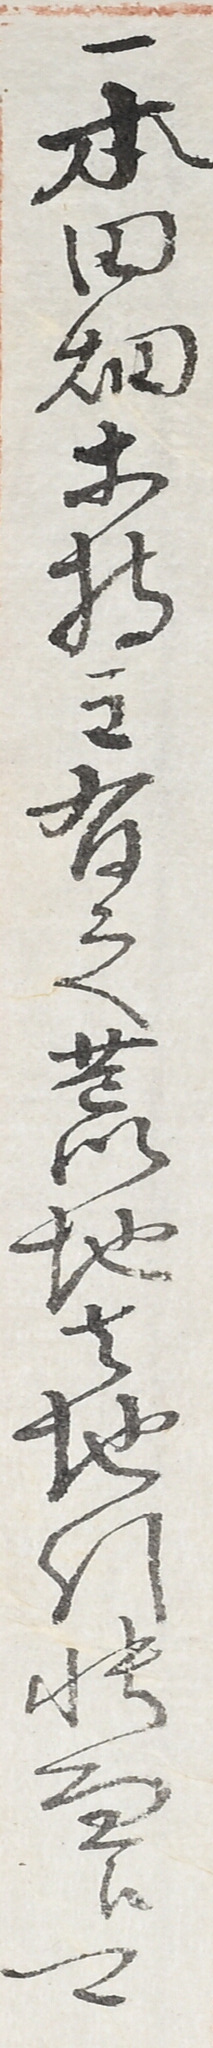一本田畑等持主有之荒地は地引帳面え可
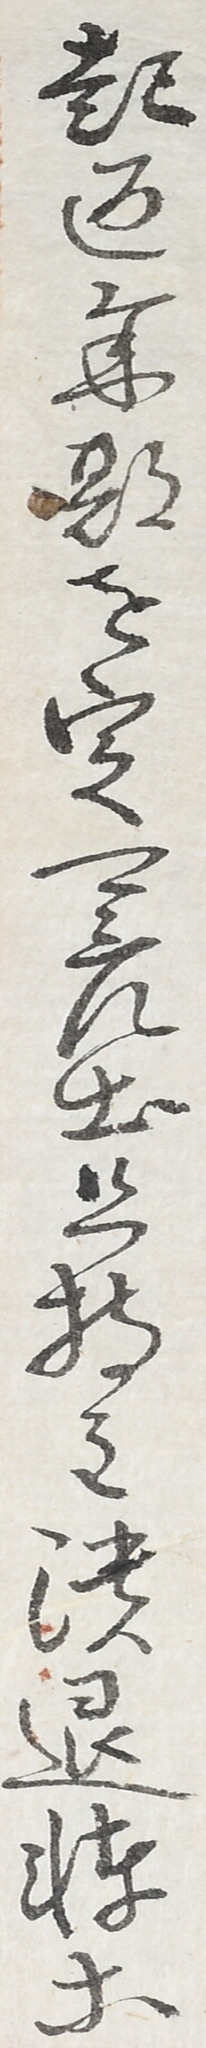起返参期を定可差出且持主潰退転転等
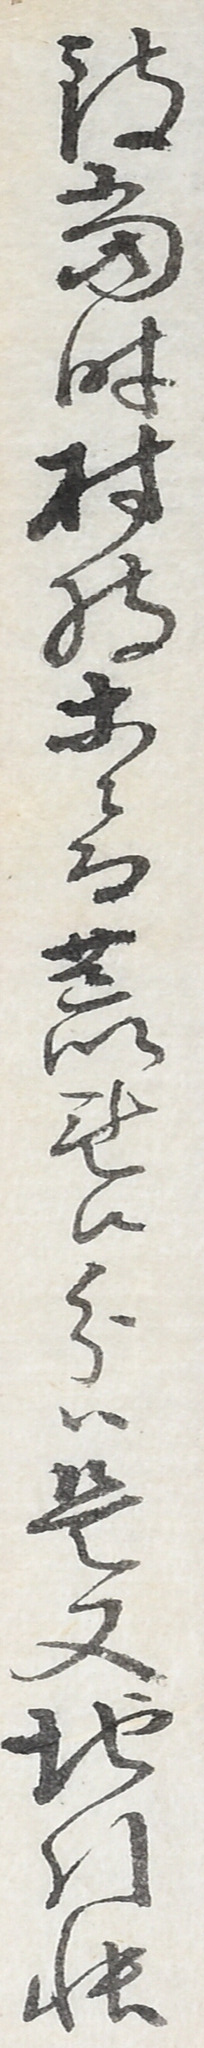致当時村持等ニ而荒れ候分ハ是又地引帳

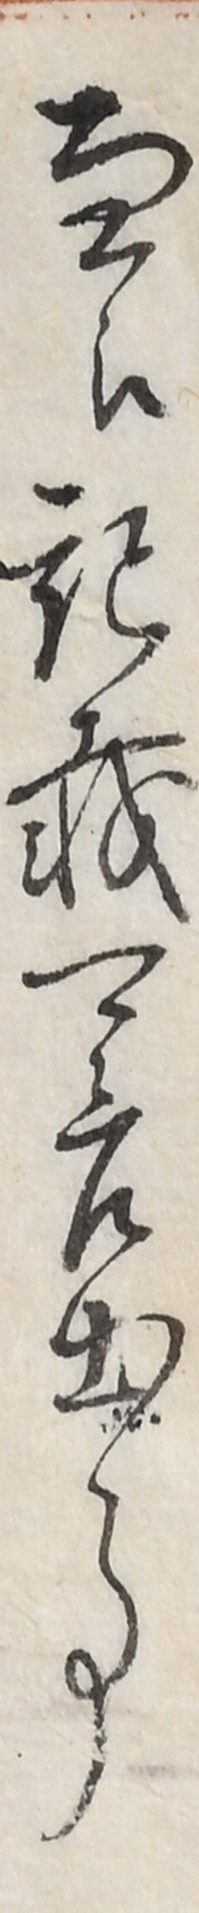面え記載可差出事
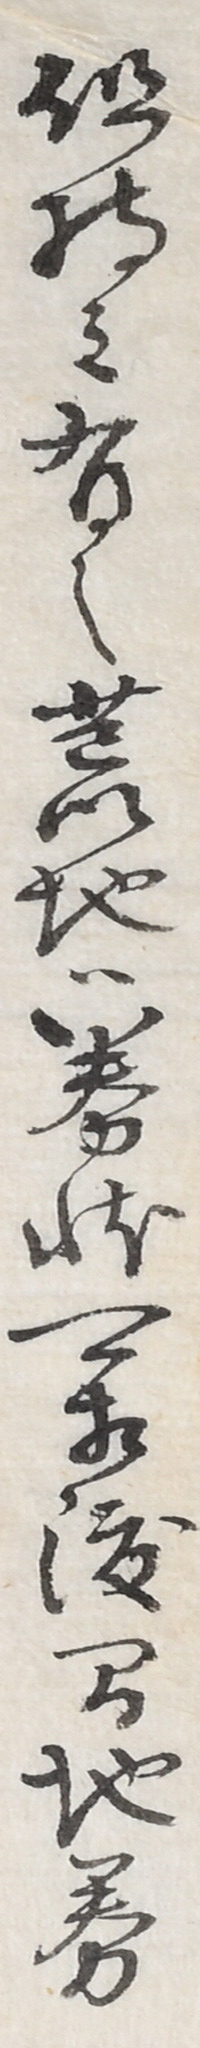但持主有之荒地は券状可相渡間地券
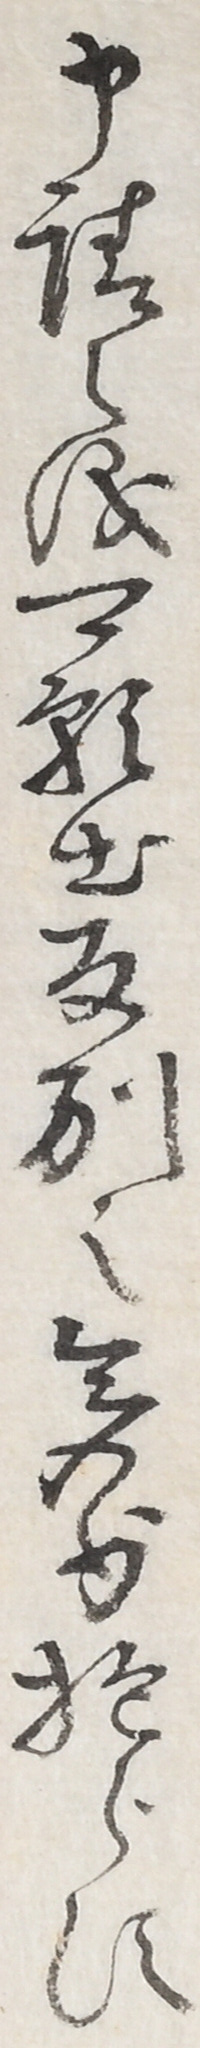申請之儀可願出反別之多少拘らす
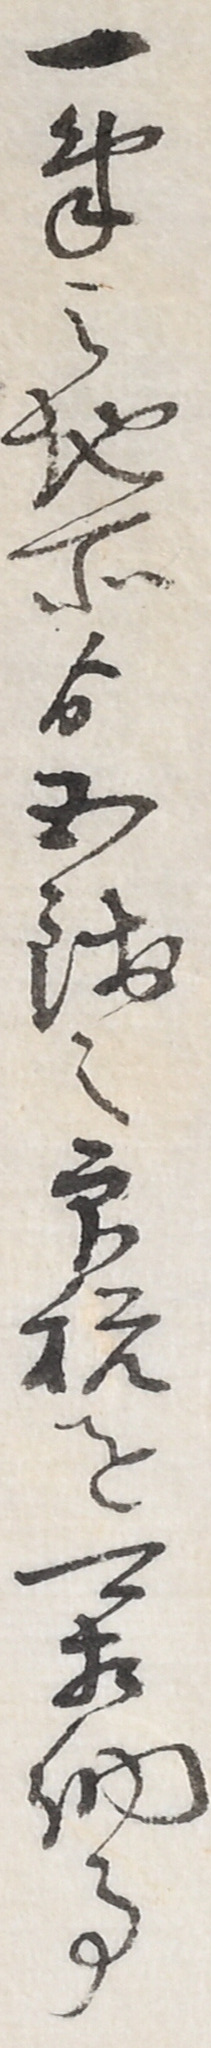一筆之地所より五銭之印税を可相納事
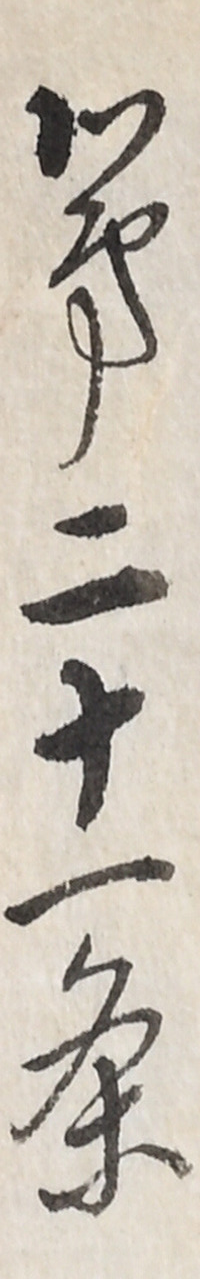第二十一条
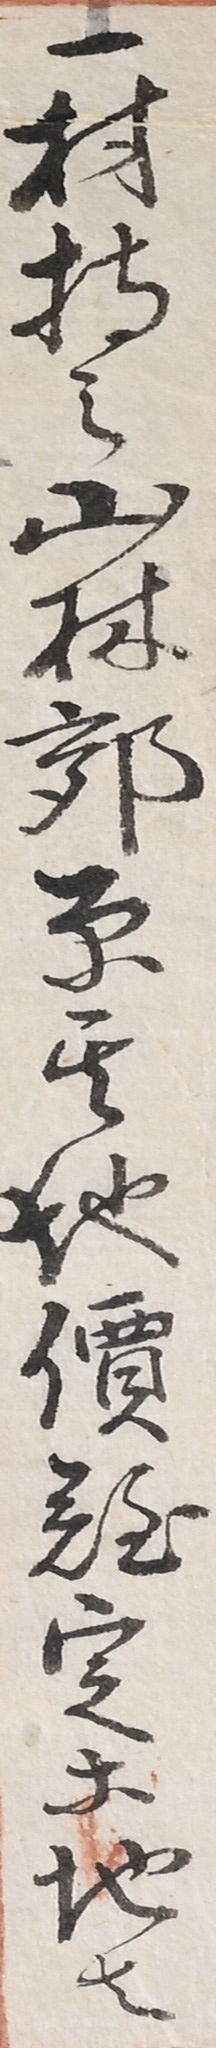一村持之山林郊原其地価難定等地は
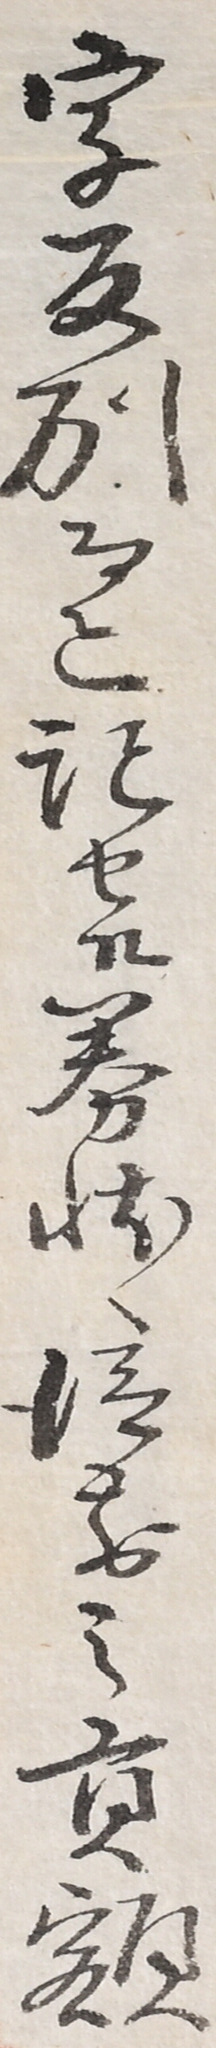字反別而已記せる券状へ従前之貢額
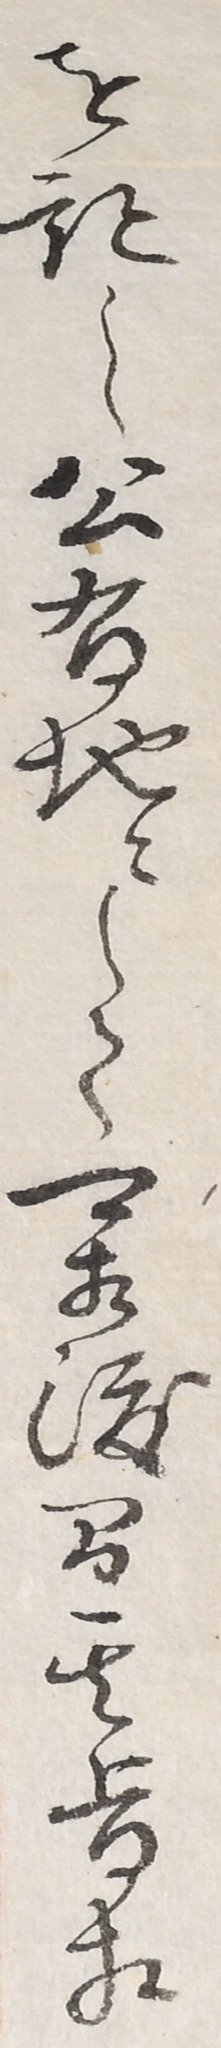を記し公有地として可相渡間其旨相
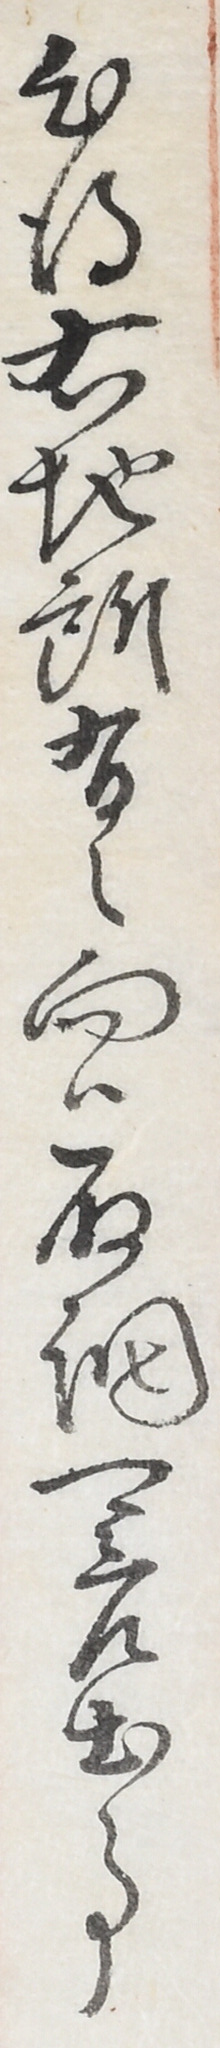心得右地所有之向は取調可差出事
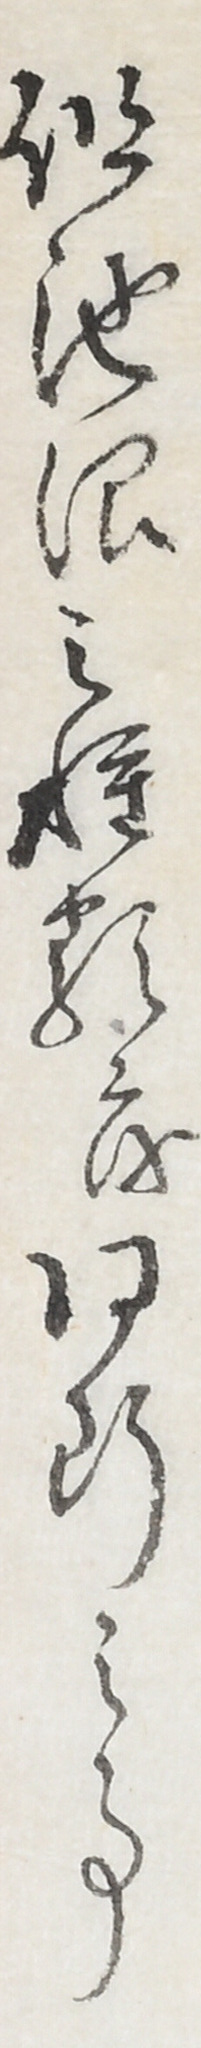但池沼之種類も同断之事
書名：壹番・御布告一式
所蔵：伊那市立高遠町図書館・合同会社AMANE
